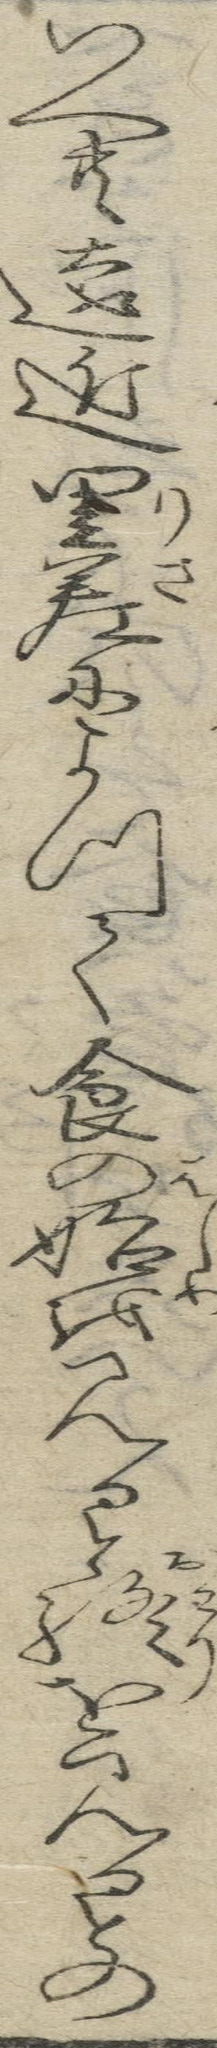いへ共遠近里差によつて食の始を見ると終を見るとの
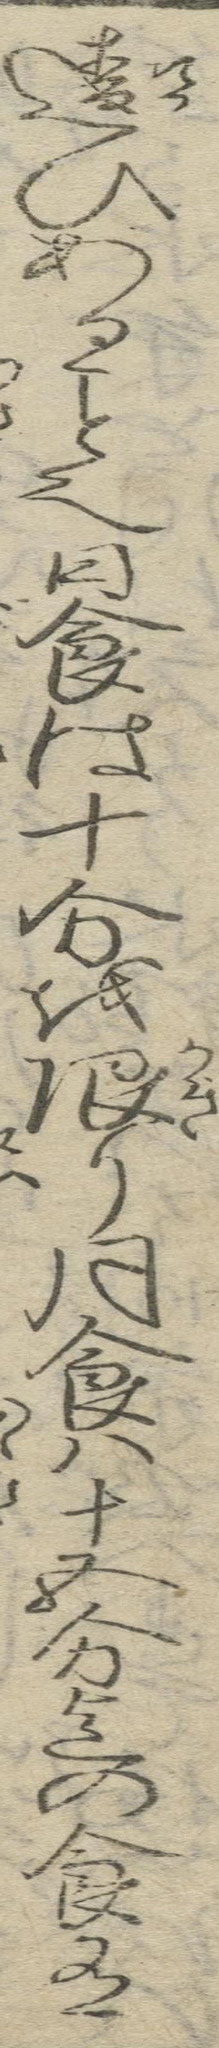違ひあること也日食は十分を限り月食は十五分迄の食有
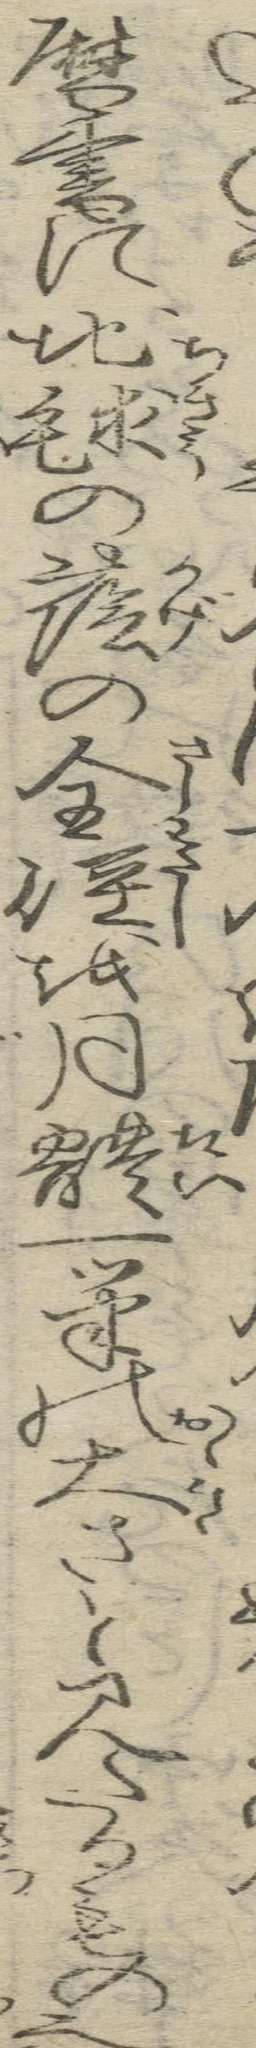暦書に地毬の蔭の全経を月体一筆の大さと見たるもの也
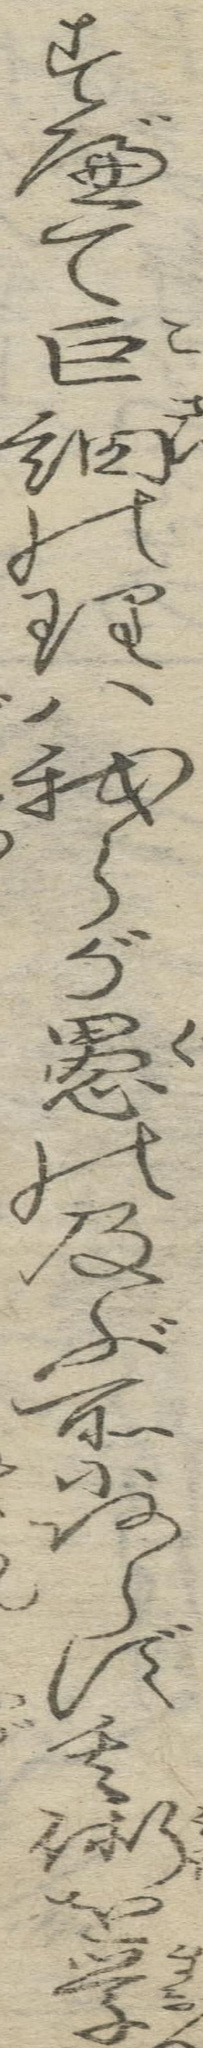すべて巨細の理は我らが愚の及ぶ所にあらず其術を学
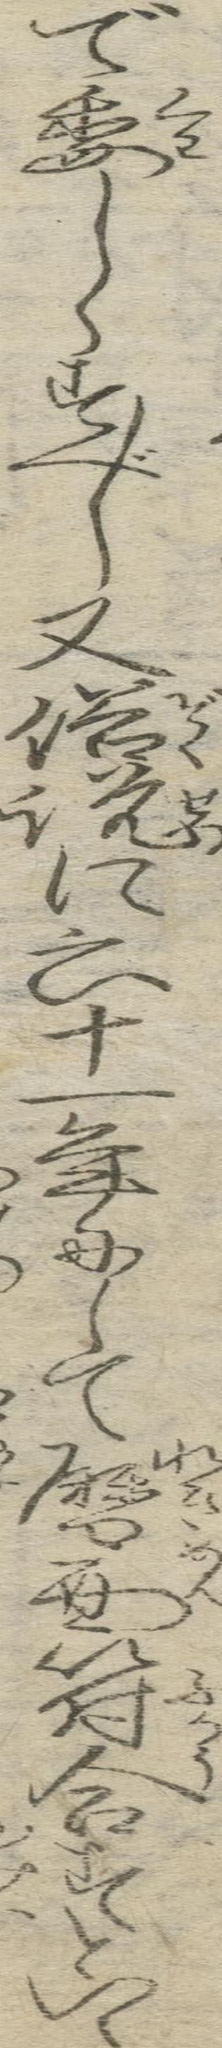で委しくすべし又俗説に六十一年にして暦面符号すといゝ
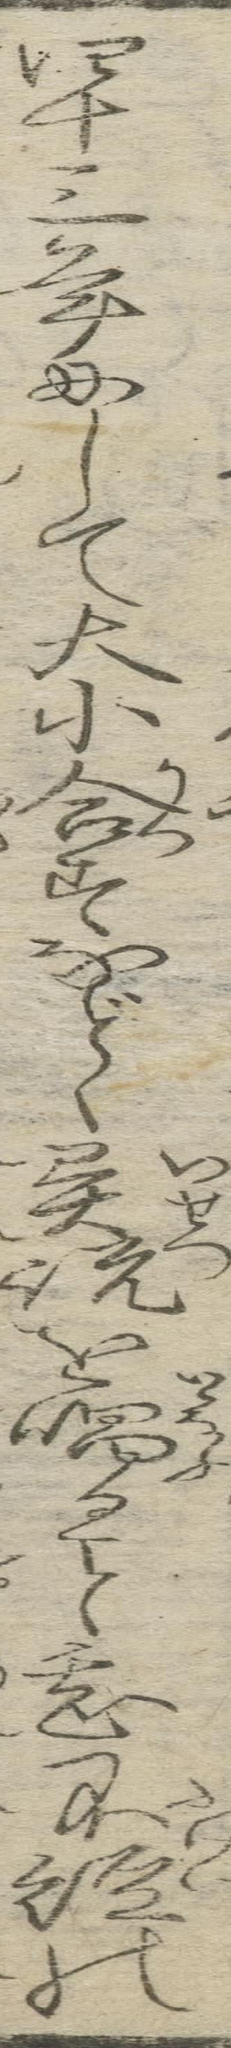四十三年にして大小合すなどゝ異説を唱ること甚だ不経の
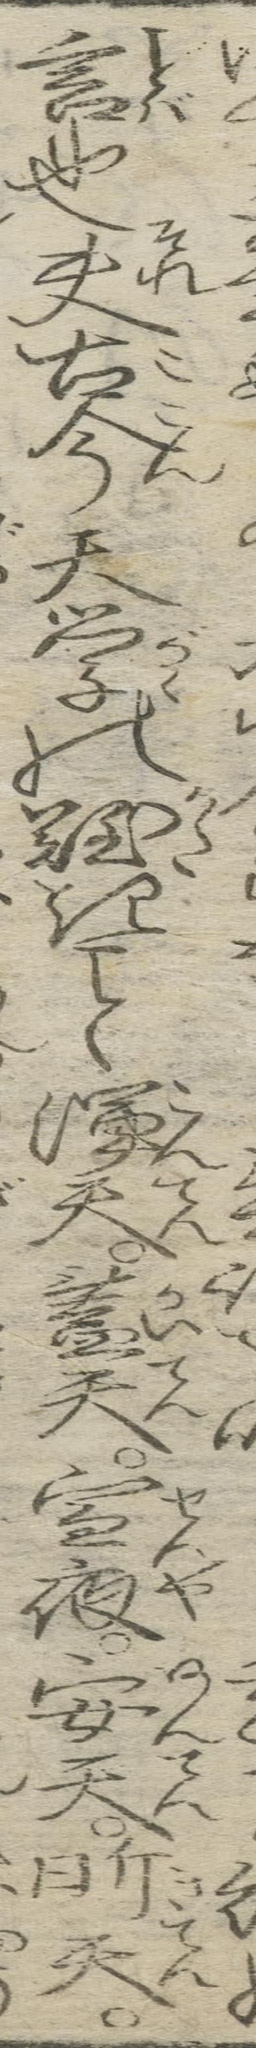言也夫古今天学の難きこと渾天。蓋天。宣夜。安天。昕天。
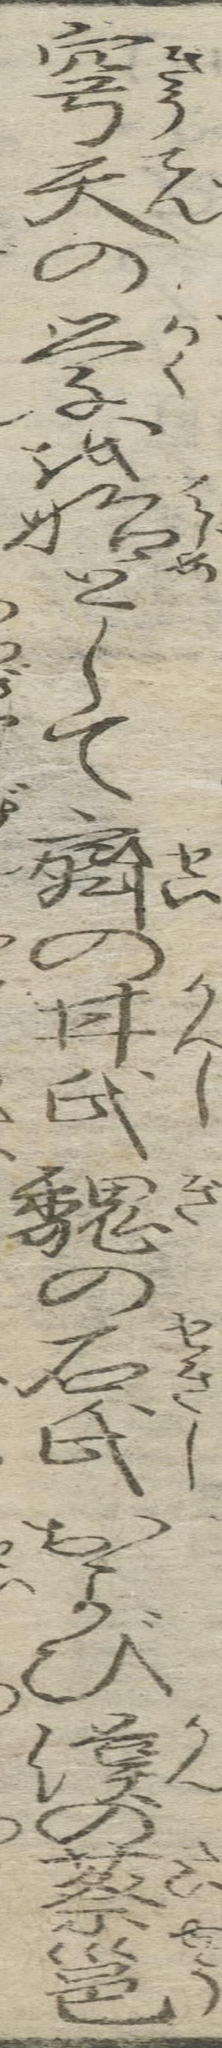穹天の学を始として斉の甘氏魏の石氏および漢の蔡邕
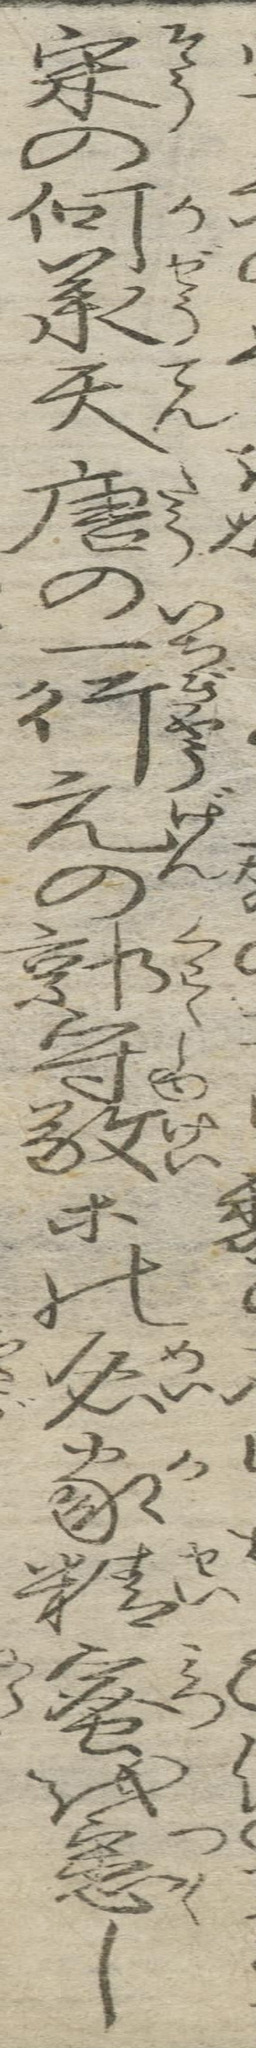宋の何承天唐の一行元の郭守敬等の名家精蜜を悉し
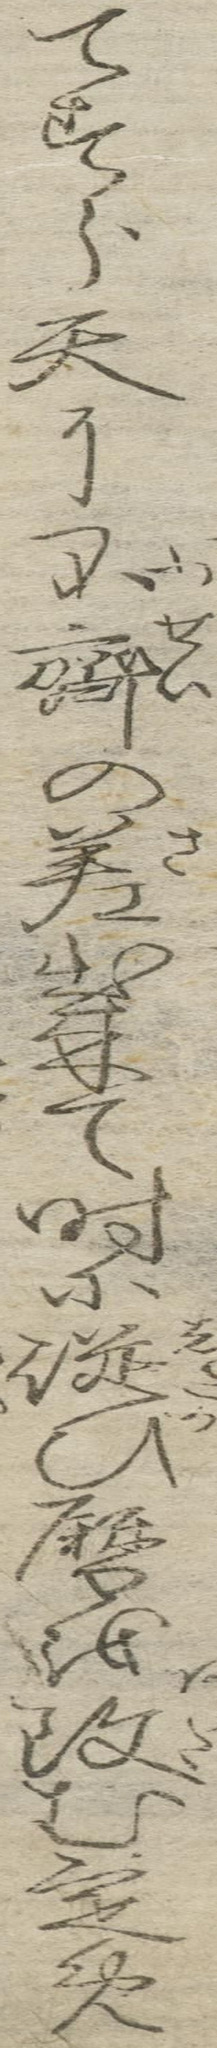てすら天に不斉の差出来て時に従ひ暦を改む定め
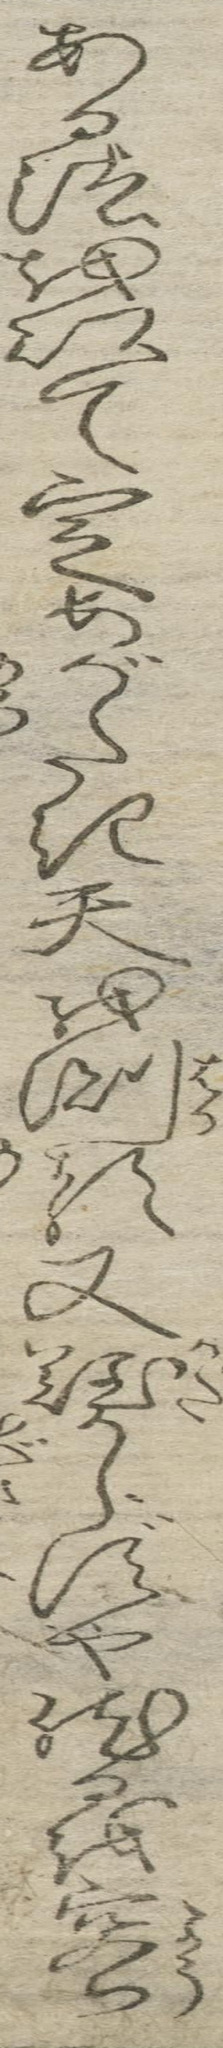ある法を以て定めがたき天を測る又難からずや然るを容
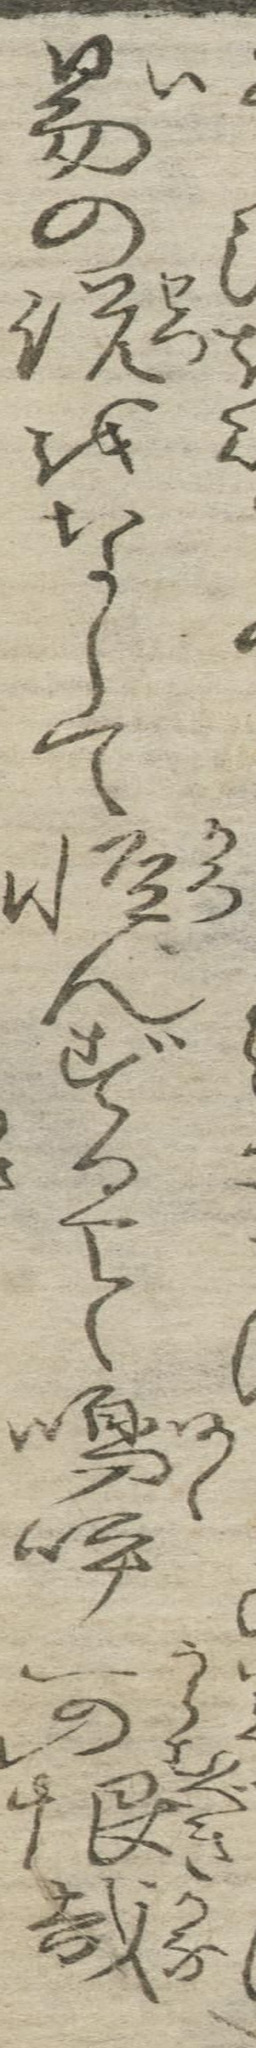易の説をなして軽んずこと嗚呼可恨哉
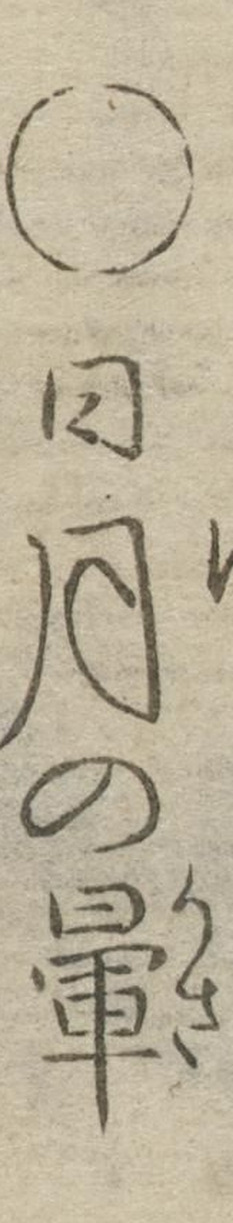○日月の暈
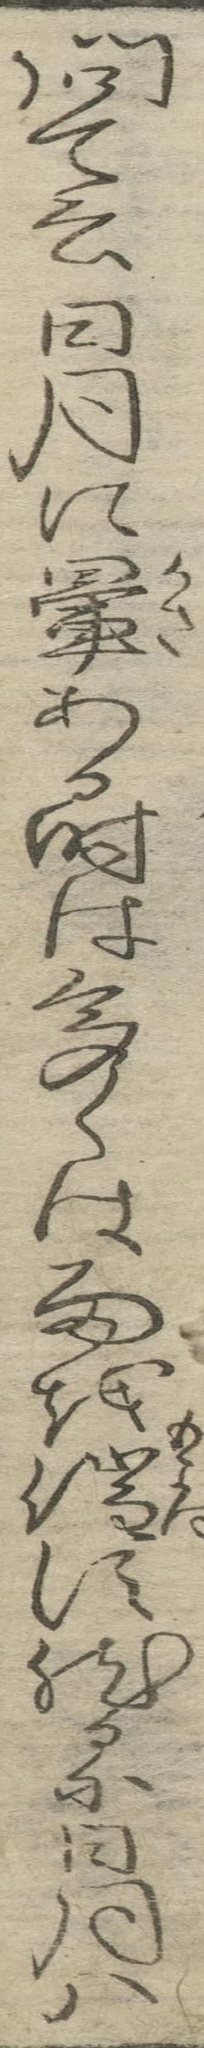問て云日月に暈ある時は多くは雨を催す然るに日月は

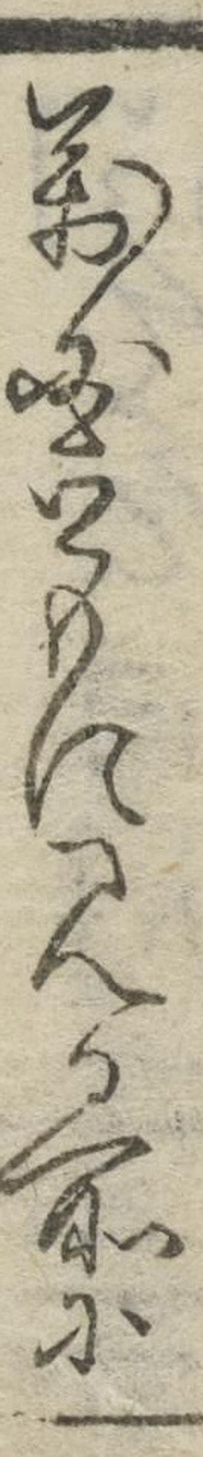万国ともに見る所に
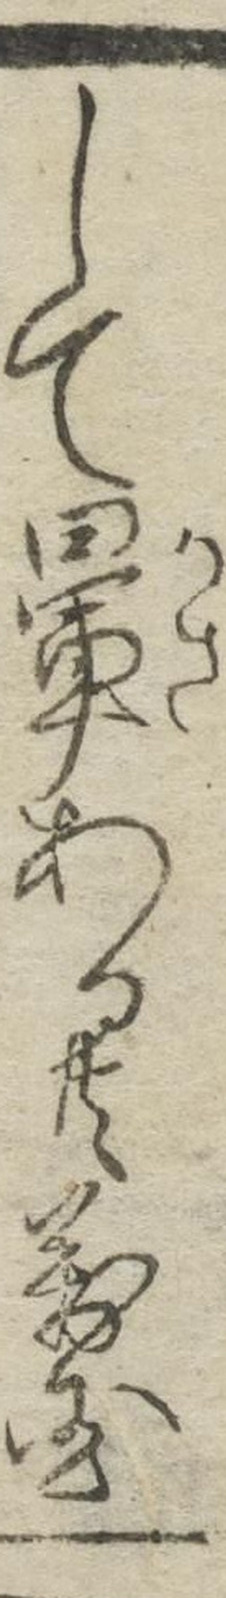して暈ある共万国
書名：訓蒙天地辨　天
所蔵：東京大学地震研究所図書室 Earthquake Research Institute Library, The University of Tokyo, JAPAN
